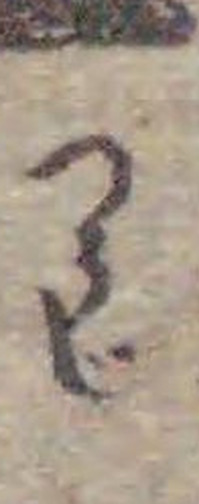つうじ
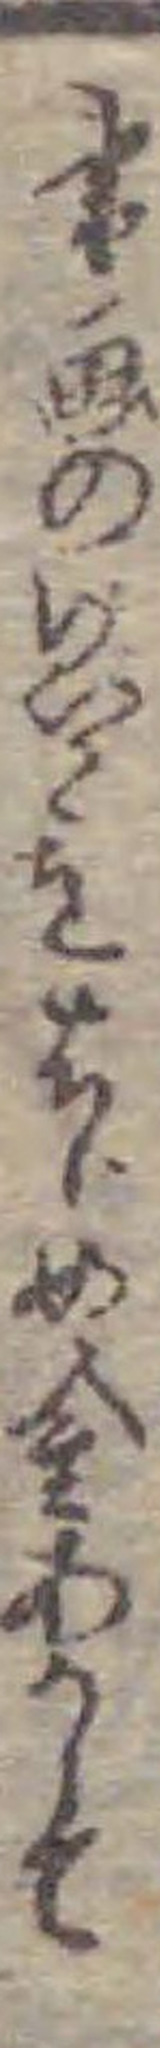書画のけいこをはじめ金あかして
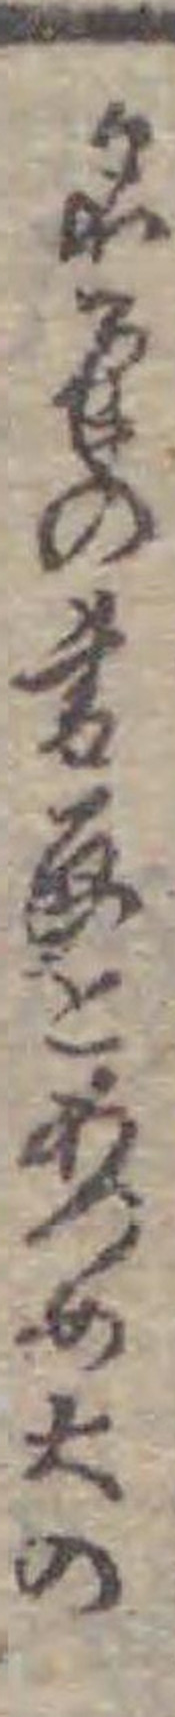名筆の書画をあつめ大の
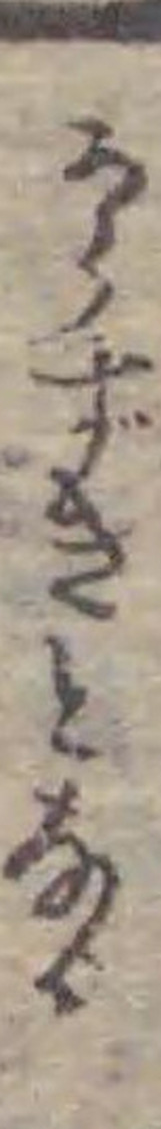からずきとなる
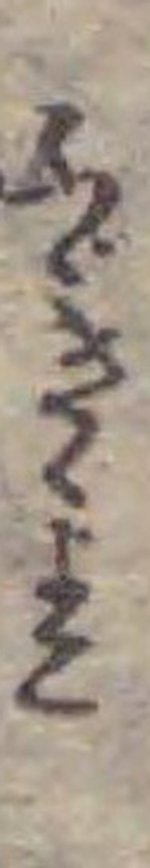ふゞきゝよこ？
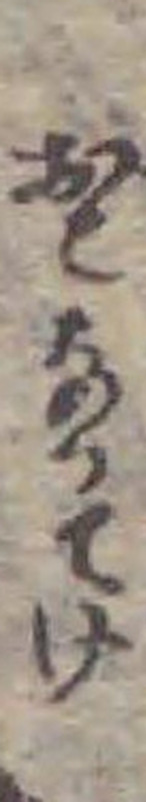おこなつてけ
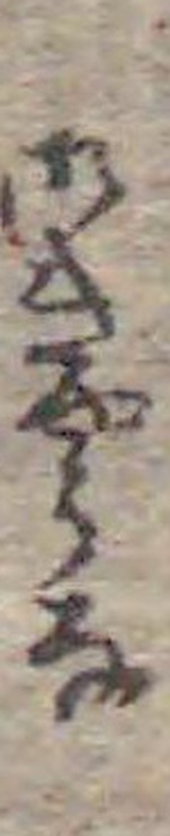御きやうな
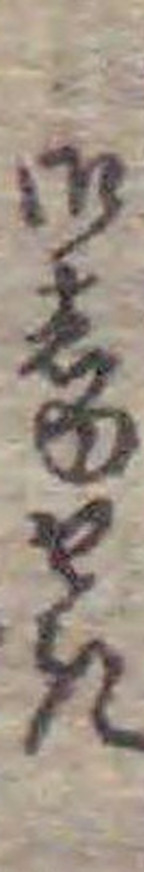御しゆせき
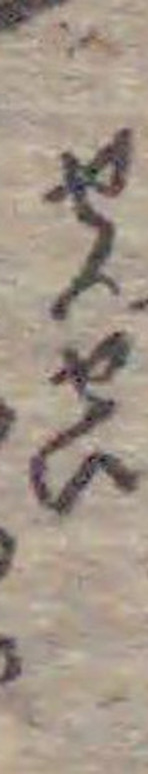せんせい
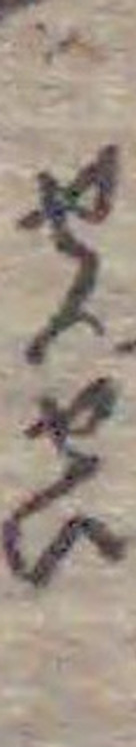せんせい
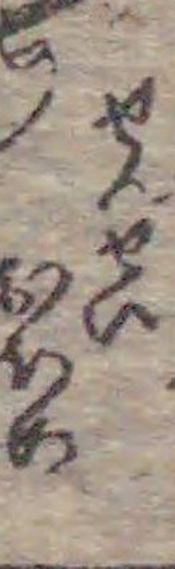せんせい
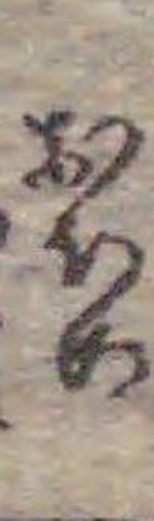おほめ
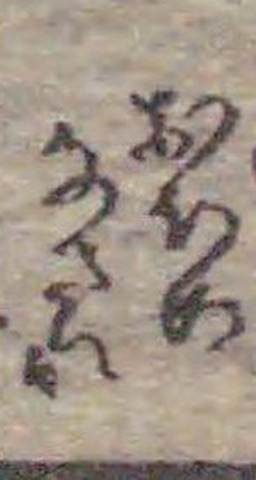なさい
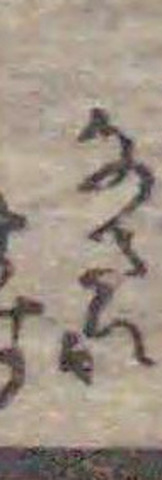なさい
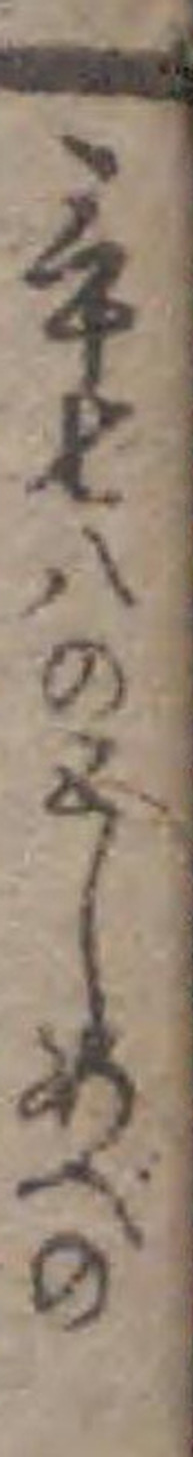三十七八のとしあべの
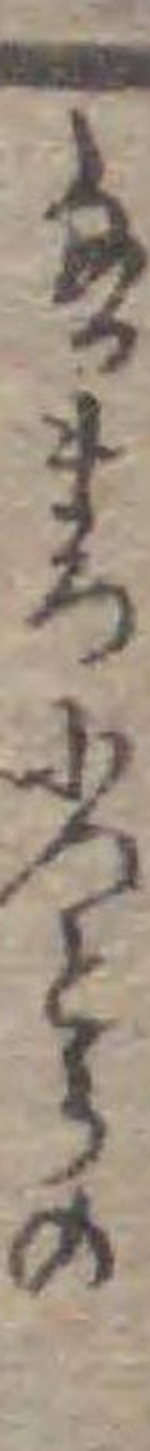なかまろにつとうの
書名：見徳一炊夢 : 3巻
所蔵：国立国会図書館 National Diet Library, JAPAN
